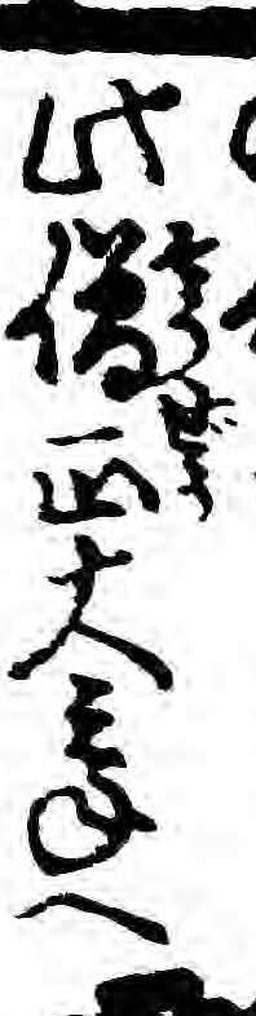此僧正大みねへ
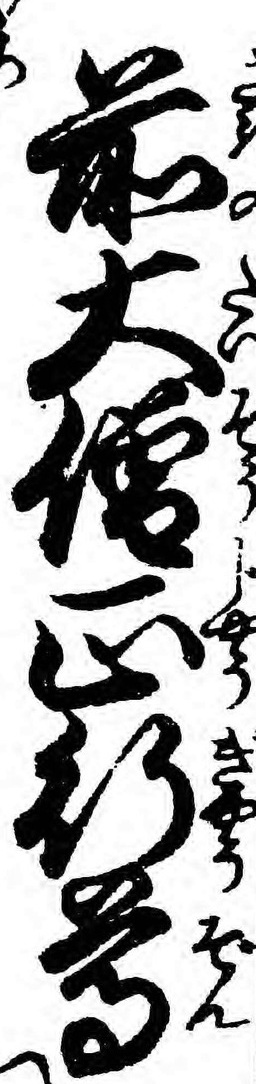前大僧正行尊
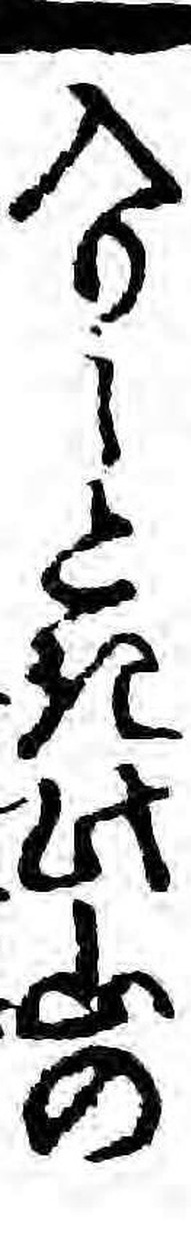入りしとき此山の
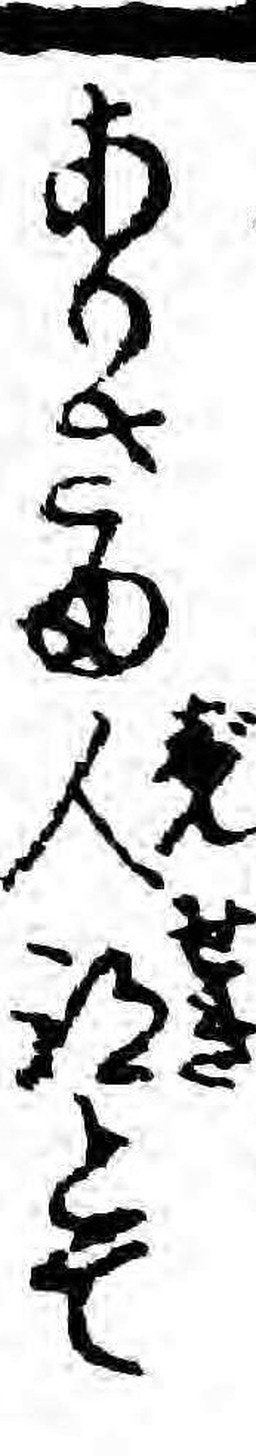ありさま人跡とて
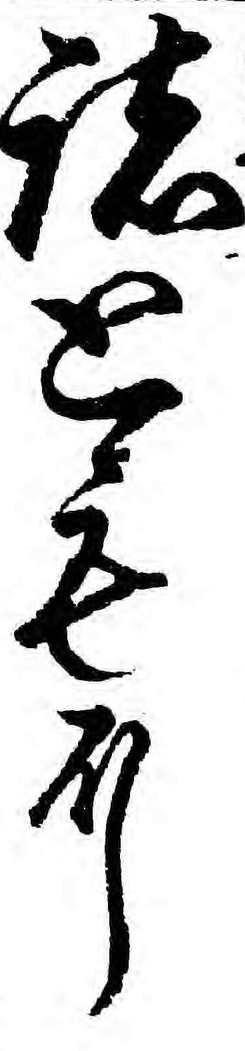諸ともに
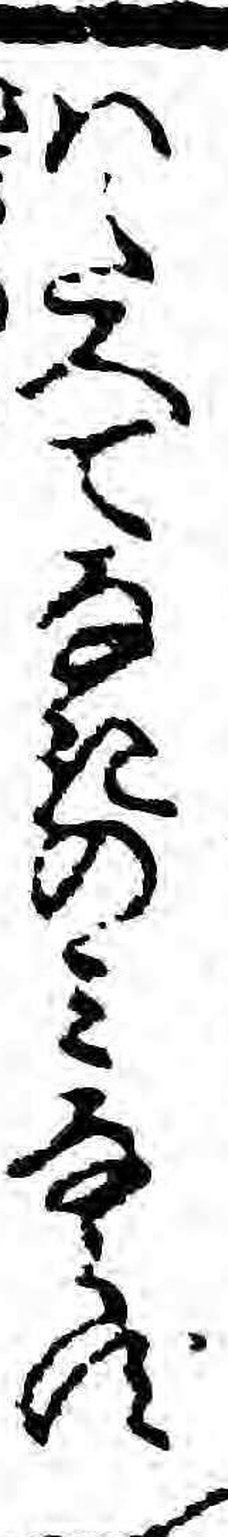はたへてなきのみならす
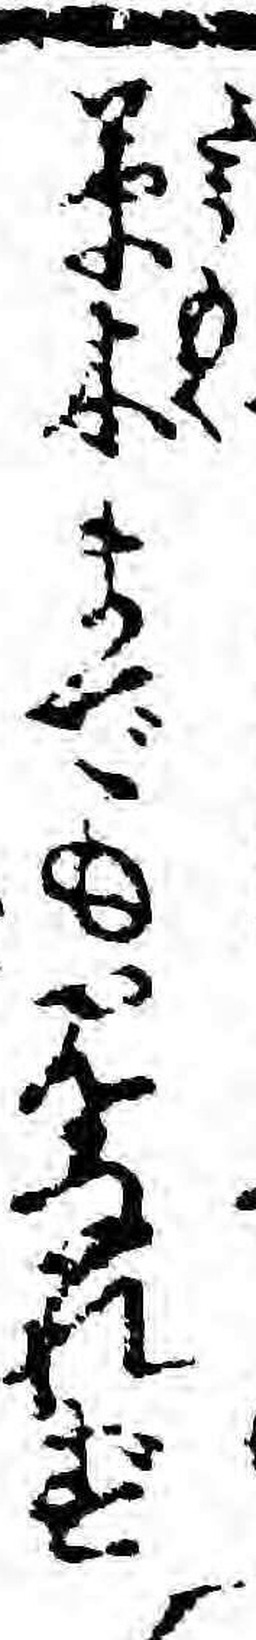草木までも見なれず
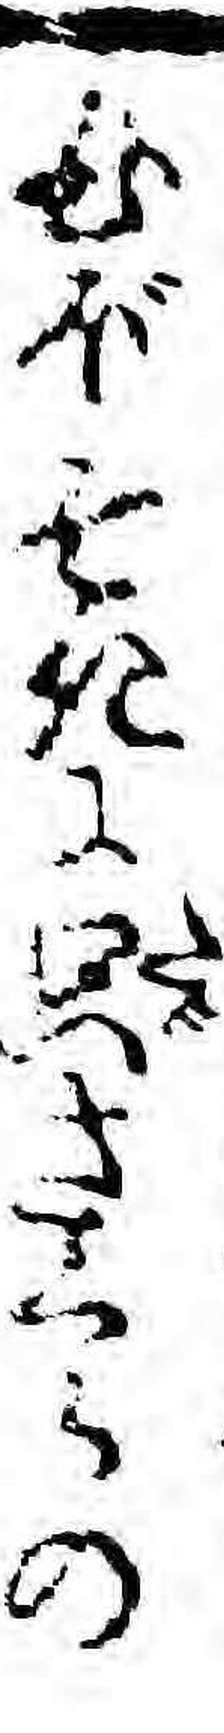心ぼそきに只さくらの
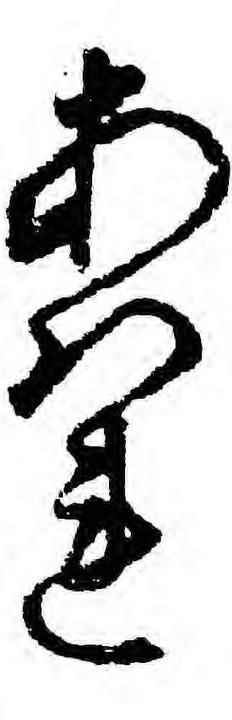あはれ
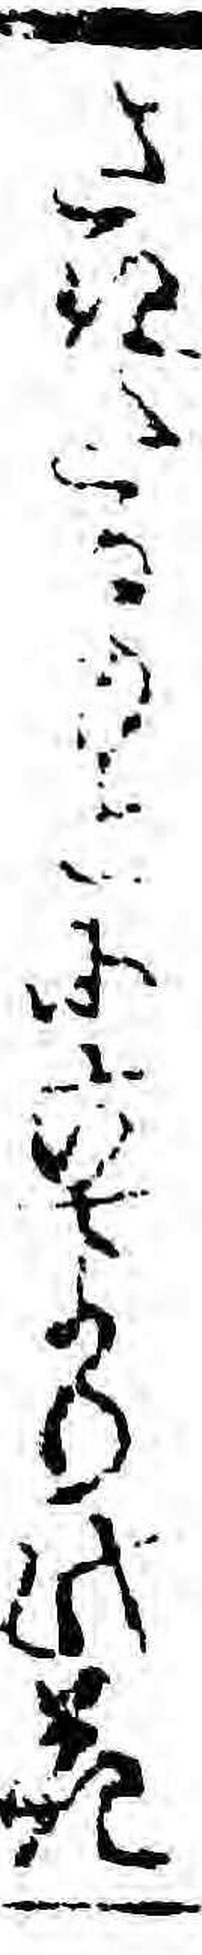さきたるもとに立より此花
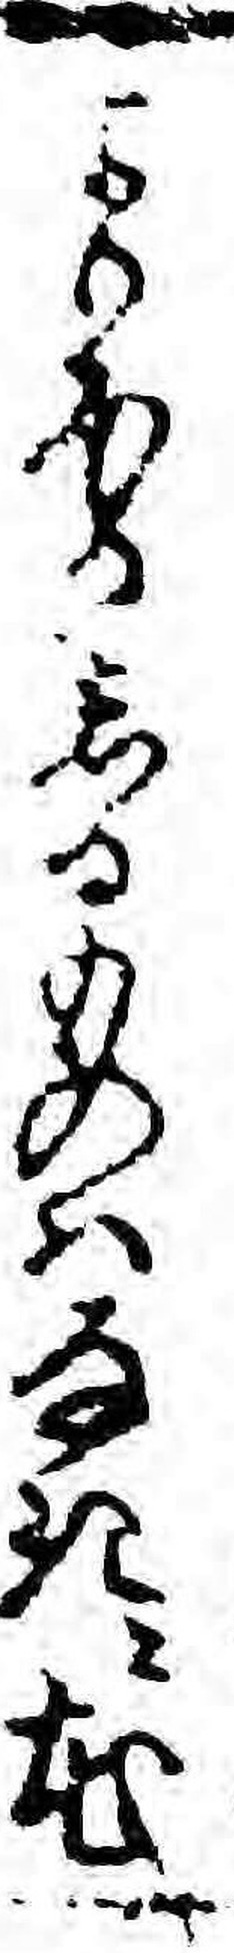よりほかしるものはなきに花
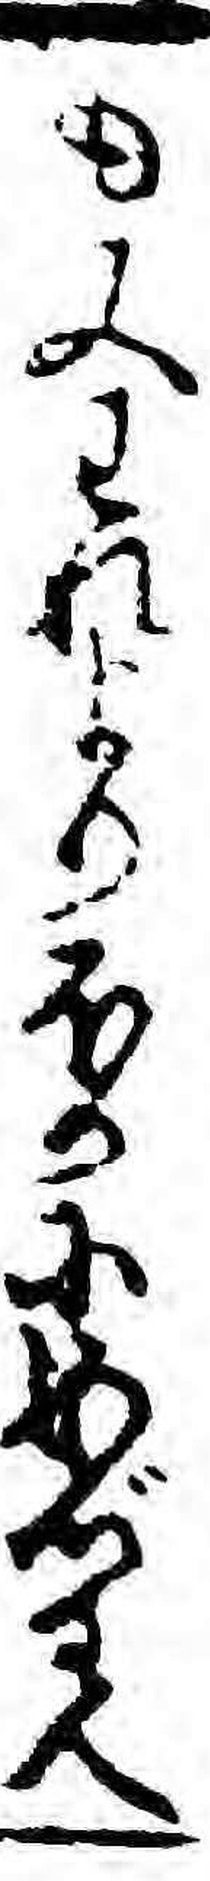も又われよりほかにめづる人
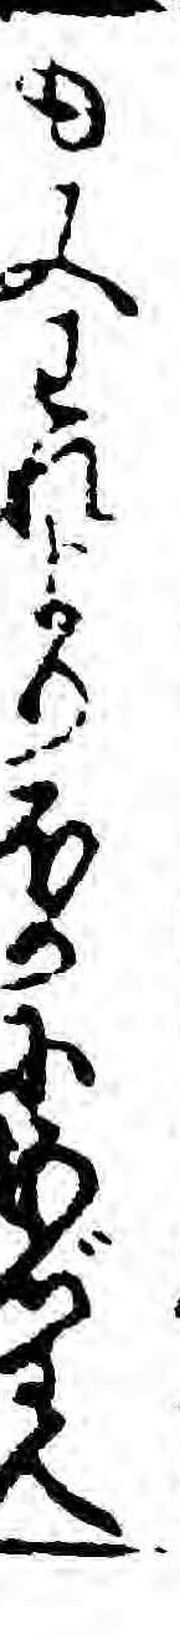も又われよりほかにめづる人
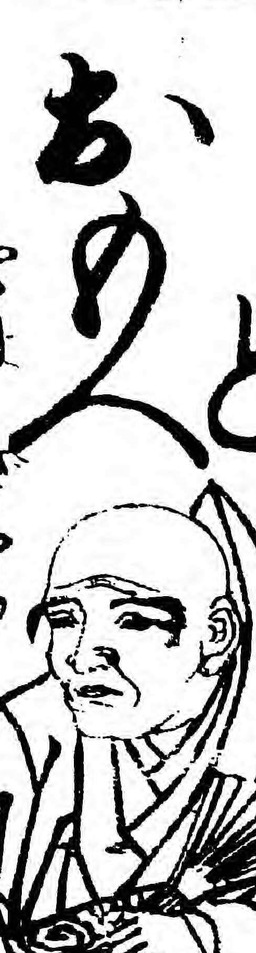おもへ
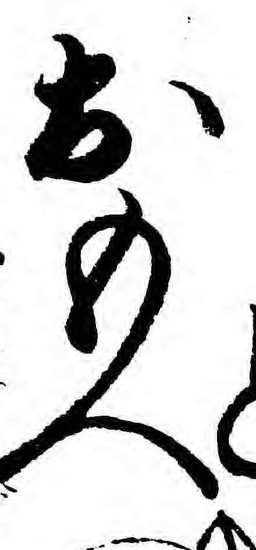おもへ
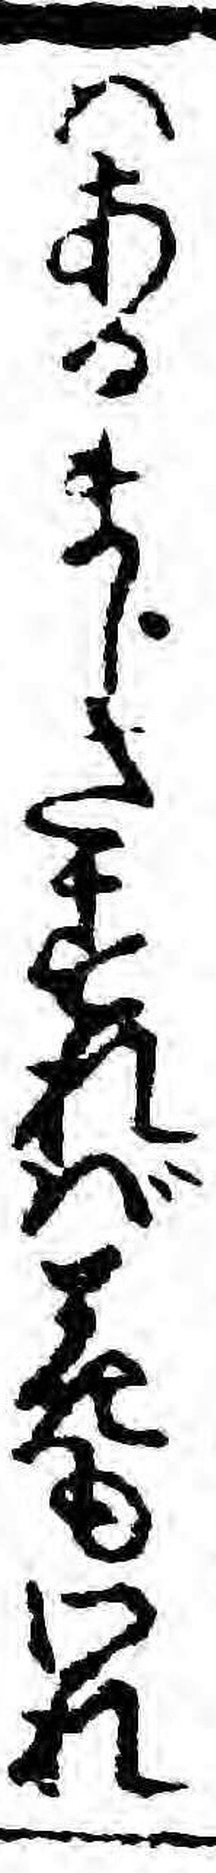はあるまじさすれば花もわれ
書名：頭書和歌注譯／壽賀多百人一首小倉錦
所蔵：国文学研究資料館
